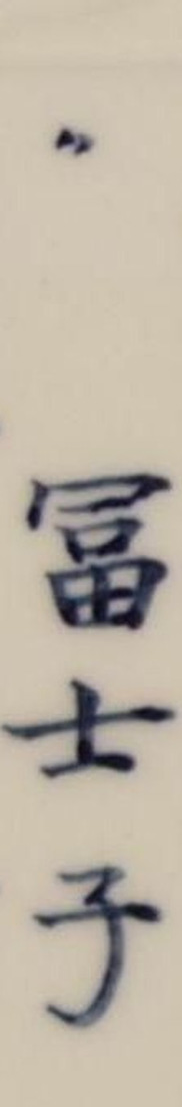冨士子
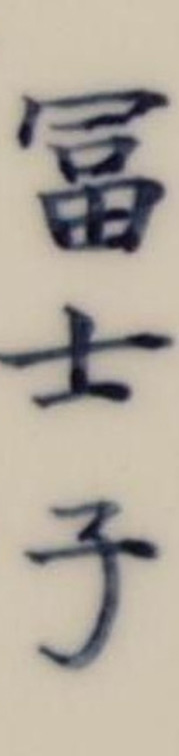冨士子
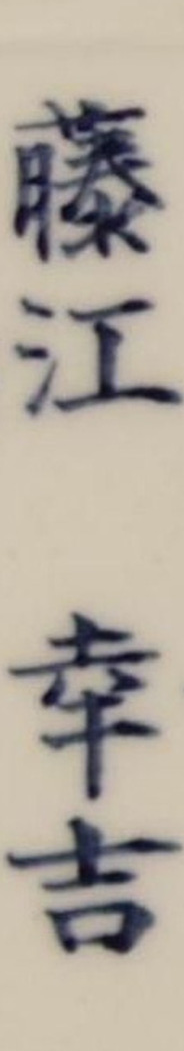藤江幸吉
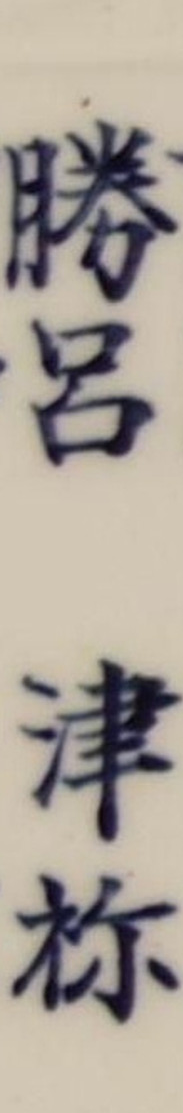勝呂津祢
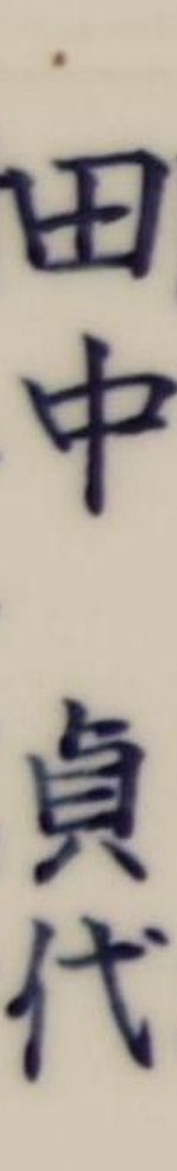田中貞代
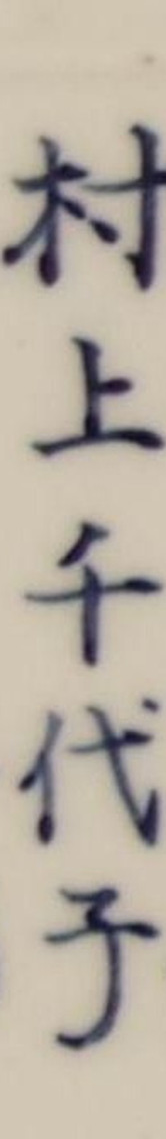村上千代子

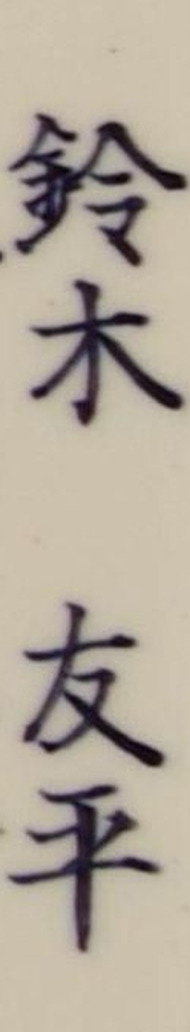鈴木友平
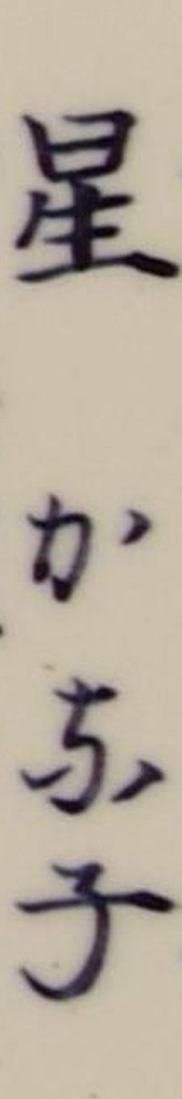星かな子
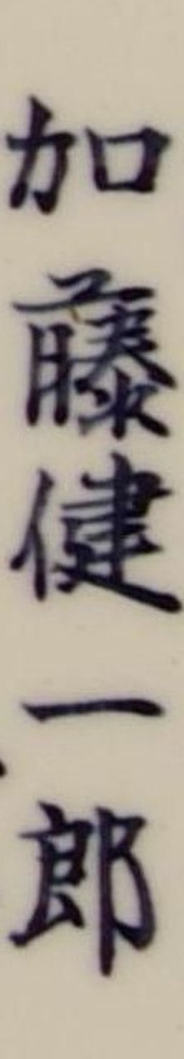加藤健一郎
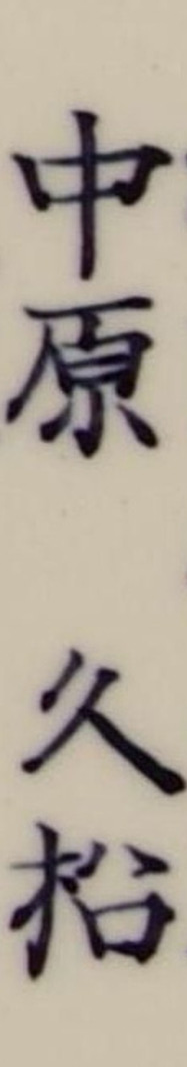中原久松
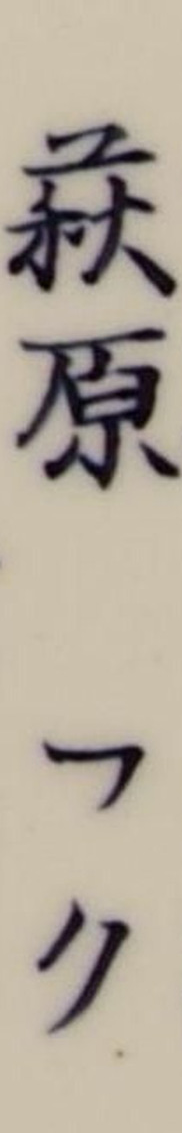萩原フク
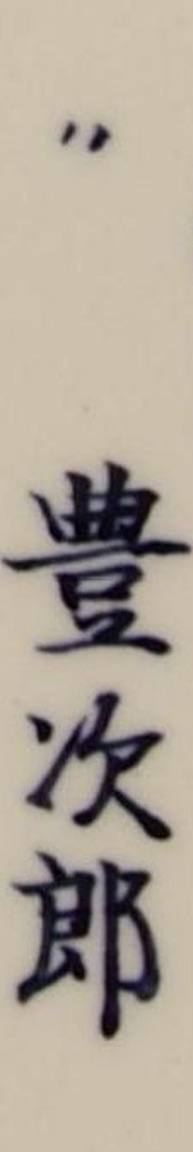豊次郎
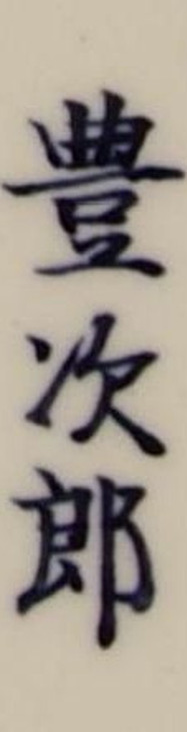豊次郎
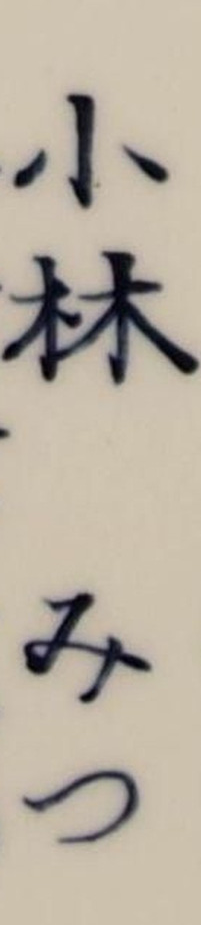小林みつ
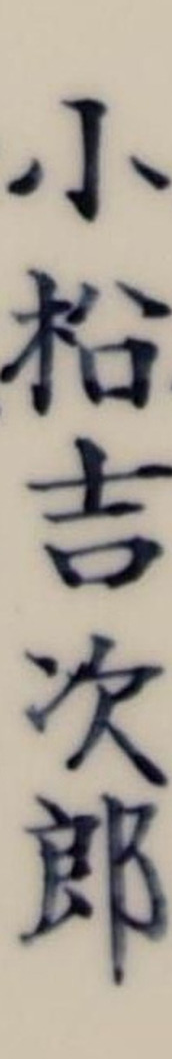小松吉次郎
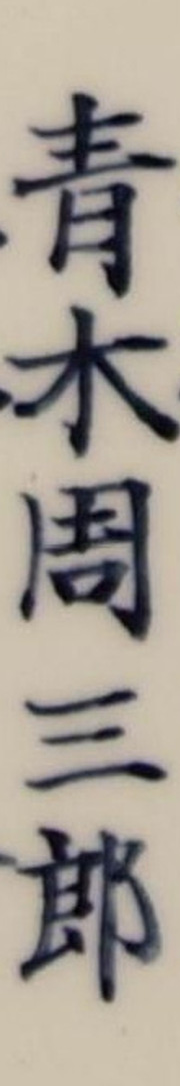青木周三郎
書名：M~S
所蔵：高野山金剛峯寺
